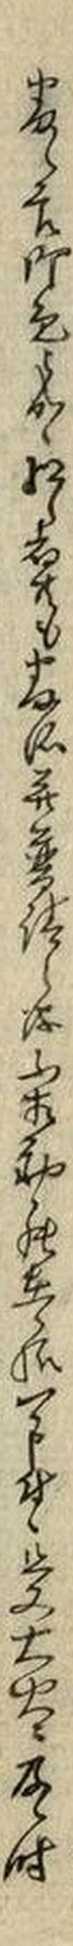番之節御免被成候組之者共も番所幷普請之儀相勤罷在候様可申付候且又大火ニ及候時
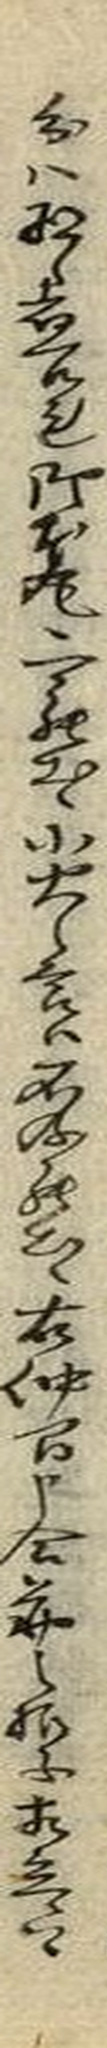分ハ組之者召連御本丸へ可罷出候小火之節ハ不及罷出候右仲間申合勤之様子相立候ハヽ
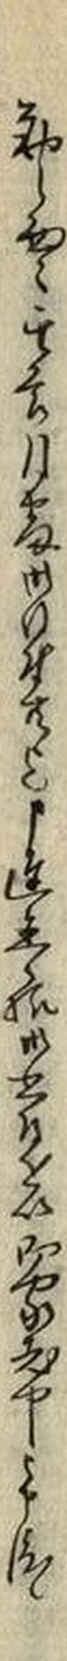勤之面々其節月番御目付共迄申達置候様御書付を以御家老中被申渡候
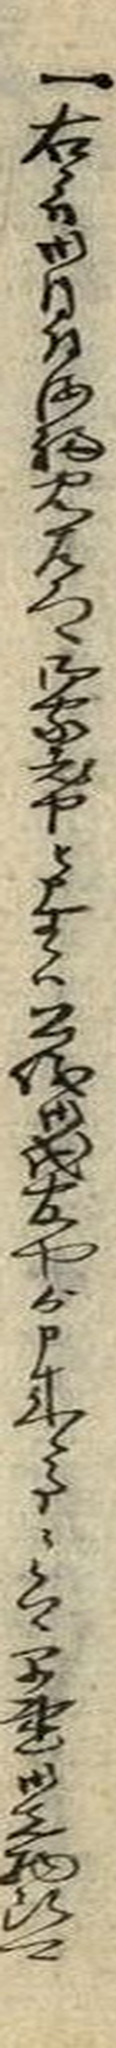一右ニ付御目付海福忠左衛門へ御家老中被申聞候ハ公儀御代官中ゟ申来候事ニ候ハヽ早速御先物頭可
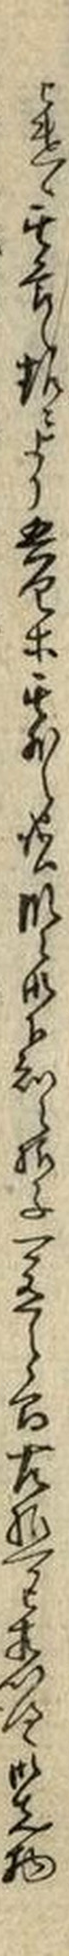被遣候其節之趣ニより兵具等其外之儀ハ段々御下知之様子可有之候間左様可被相心得候御先物
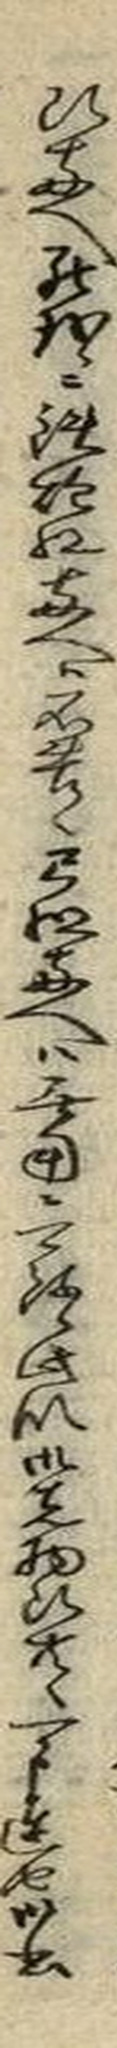頭両人罷越候ニ鉄炮組両人ハ不苦候弓組両人ハ無用ニ可致候此段御先物頭共へ可申達由御書
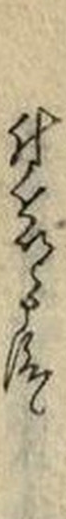付を以被申渡候
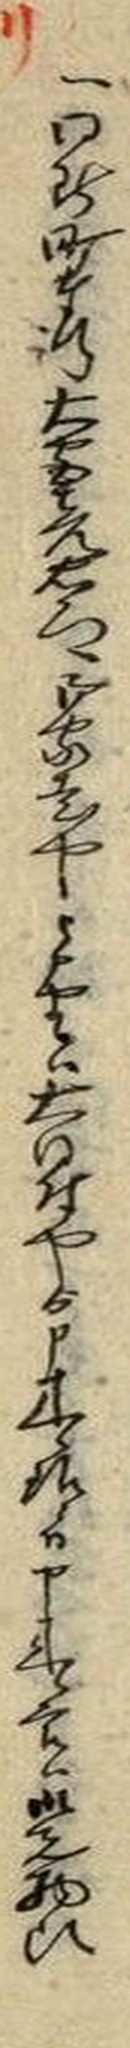一同断町奉行大宮彦右衛門へ御家老中被申聞候ハ大目付中ゟ申来候趣ニ付申来候節ハ御先物頭

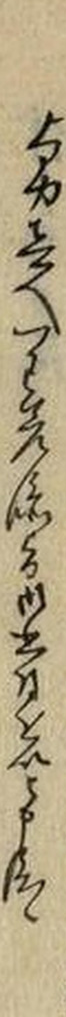与力壱人可被差添旨御書付を以被申渡候
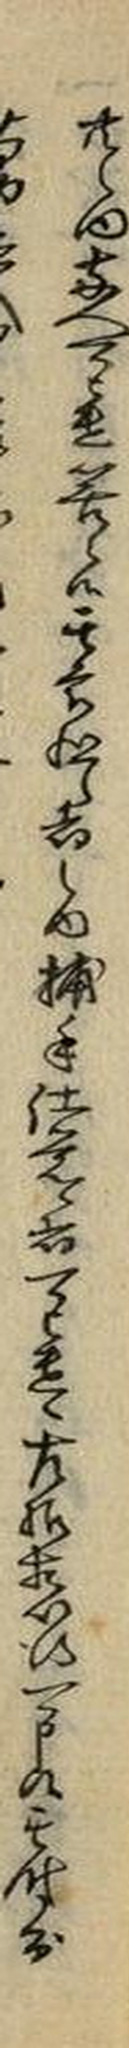共之内両人可被遣筈ニ候其節組之者之内捕手仕覚候者可被遣候左様相心得可申候其時分
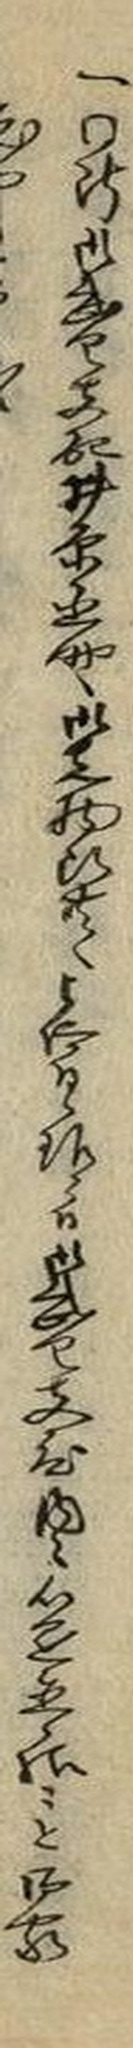一同断御武具支配井原丞助へ御先物頭共へ被仰付候趣ニ付御武具支度内々心懸置候様ニと御家
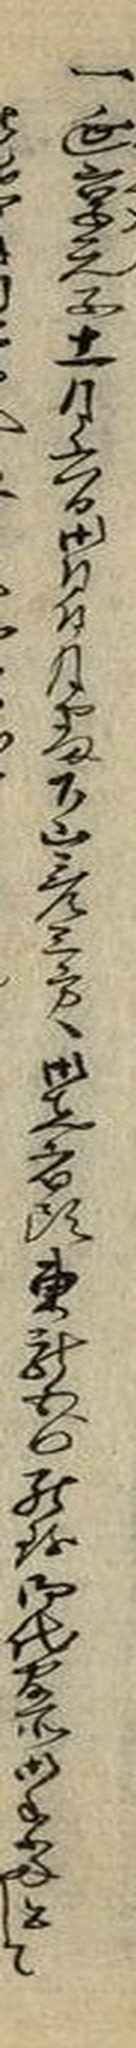一延享元子十一月六日御目付月番下山彦三方へ御先者頭東新五右衛門罷越御代官所御手当として
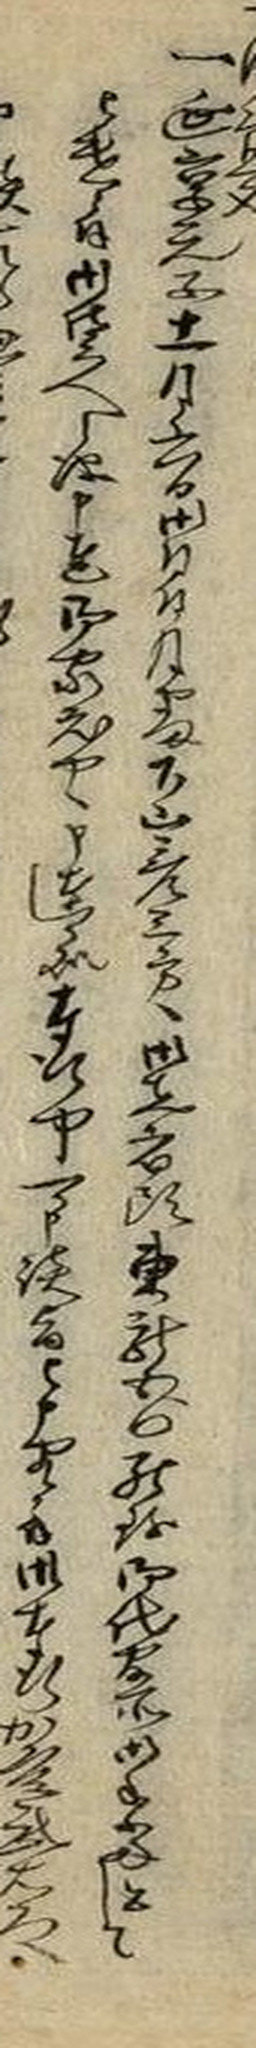被遣候ニ付御貸人之儀申達御家老中へ申達候処奉行中可申談旨被申聞候ニ付御奉行加藤武右衛門へ
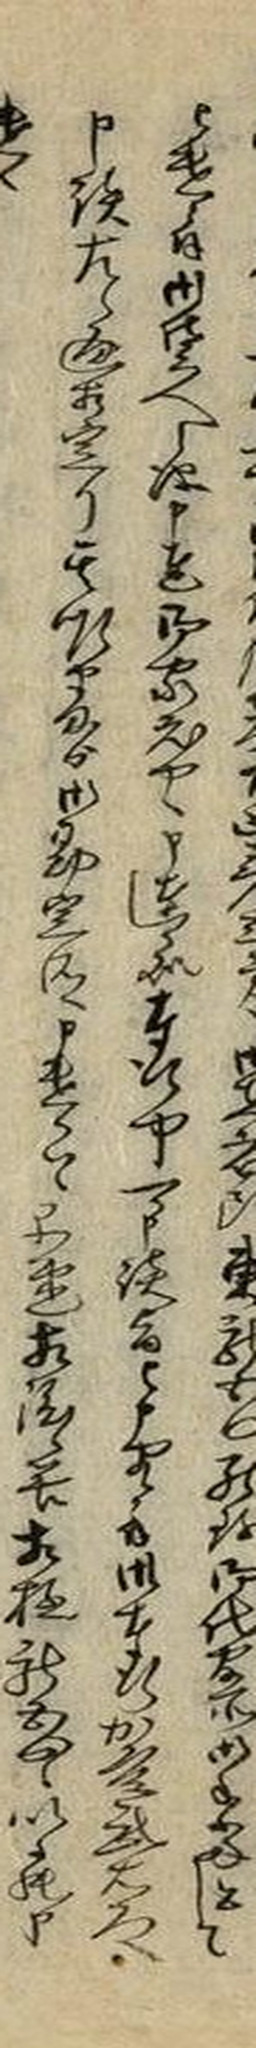申談左之通相定り其段番ゟ御勘定所へ申遣候ハヽ早速相渡候筈相極新五右衛門以手紙申
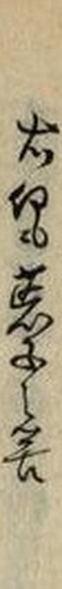右何も荒子之筈
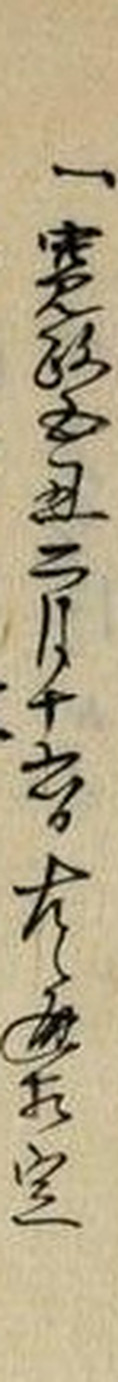一寛政五丑二月十六日左之通相定
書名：御国他国諸事之部
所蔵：福井県文書館 Fukui Prefectural Archives
